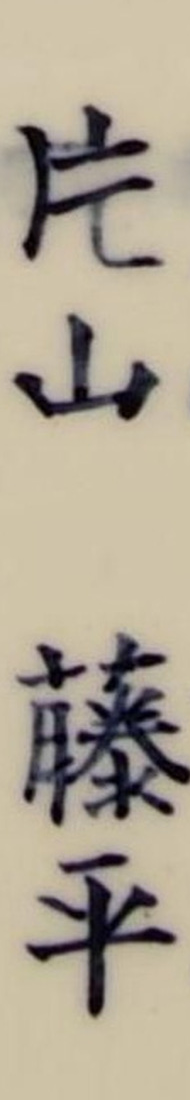片山藤平
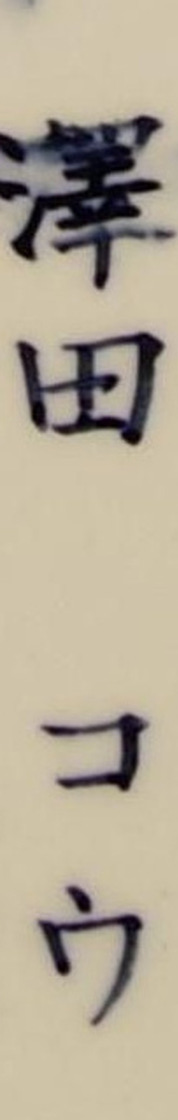澤田コウ
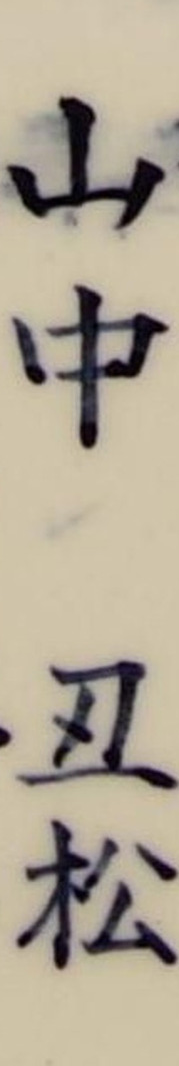山中丑松
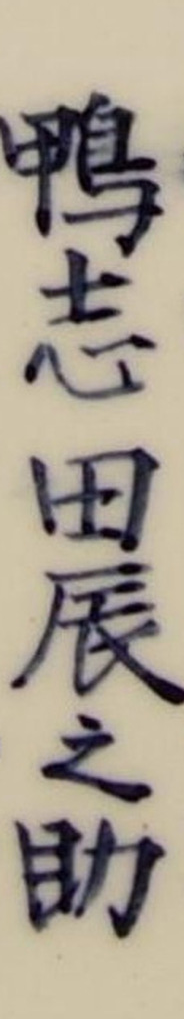鴨志田辰之助
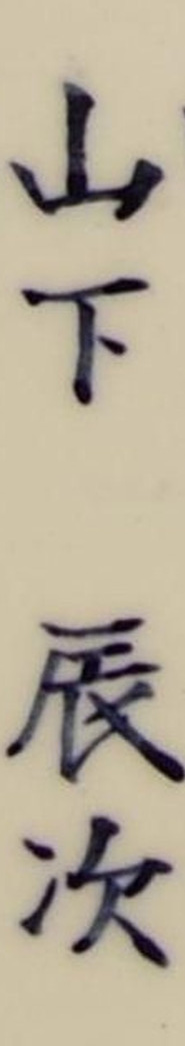山下辰次
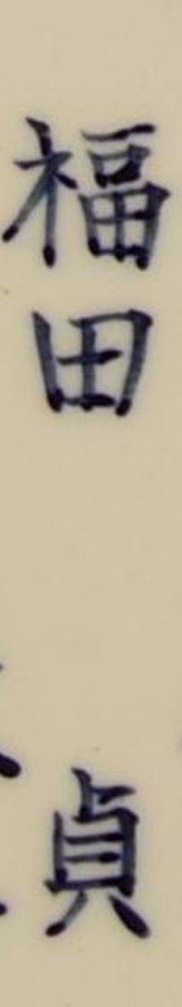福田貞
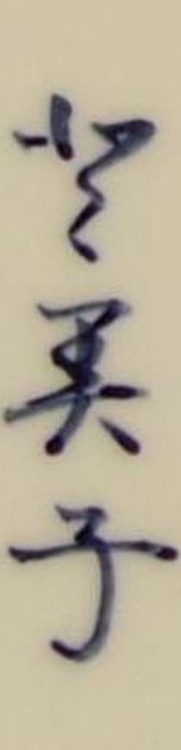とみ子
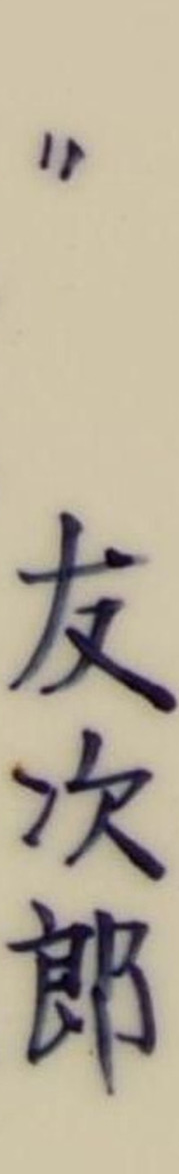友次郎
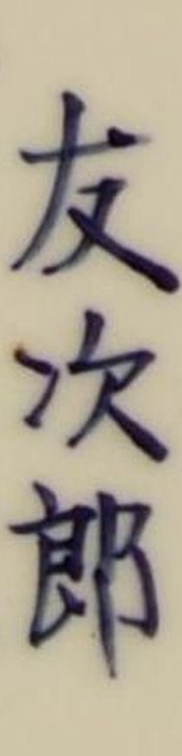友次郎
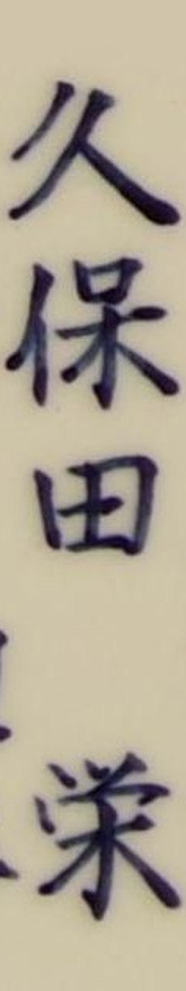久保田栄
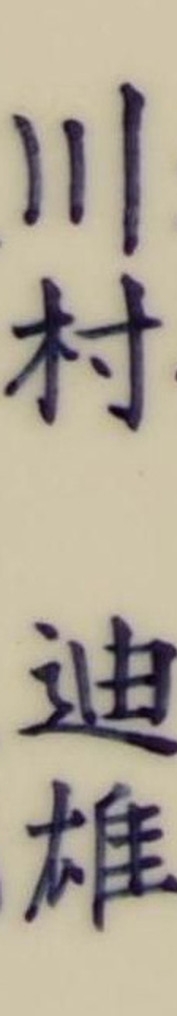川村迪雄
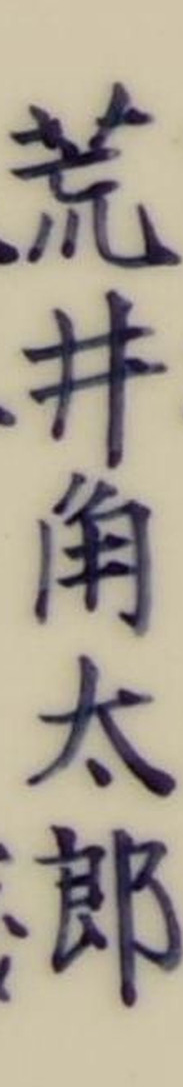荒井角太郎
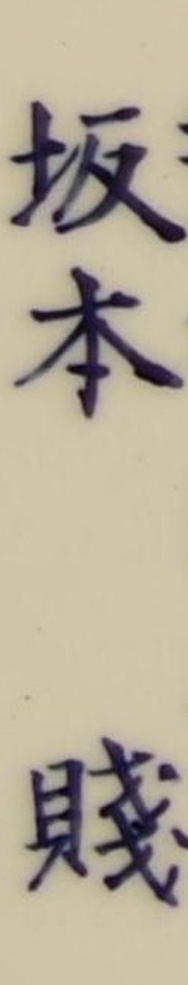坂本賤
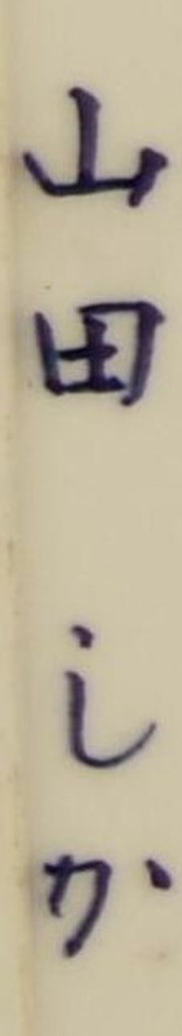山田しか

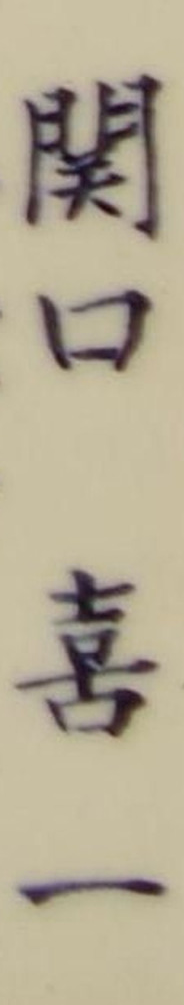関口喜一
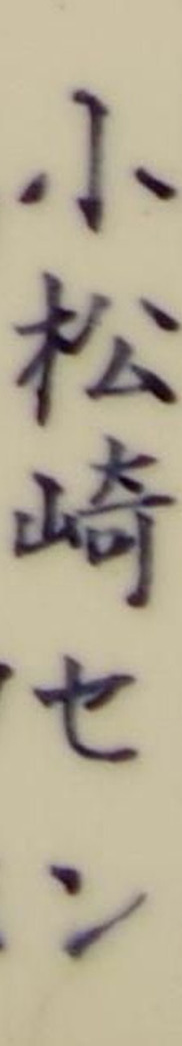小松崎セン
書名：E~L
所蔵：高野山金剛峯寺
